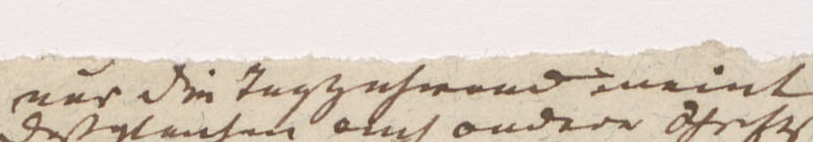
nur die Teppichwand meint.
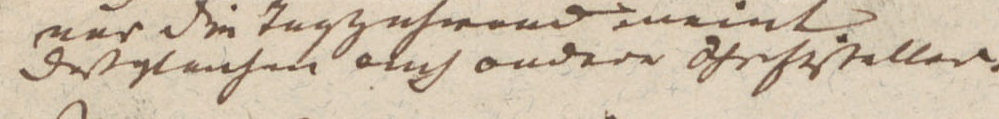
Dessgleichen auch andere Schriftsteller.
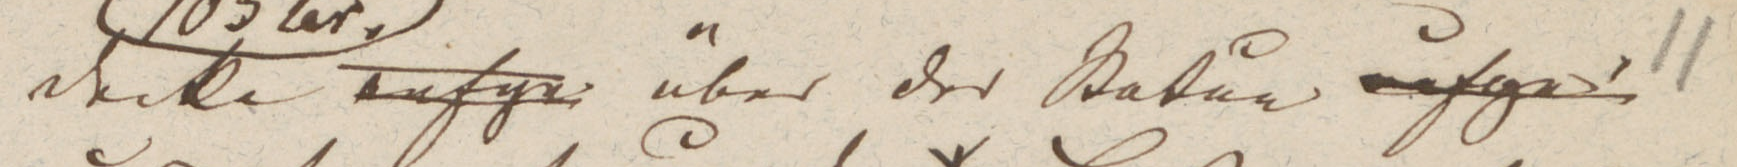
Decke aufge über der Statue aufge
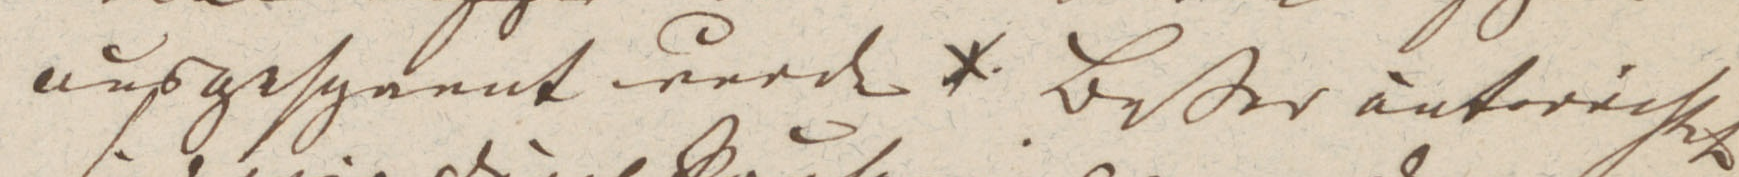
ausgespannt wurde % Besser unterrichtet
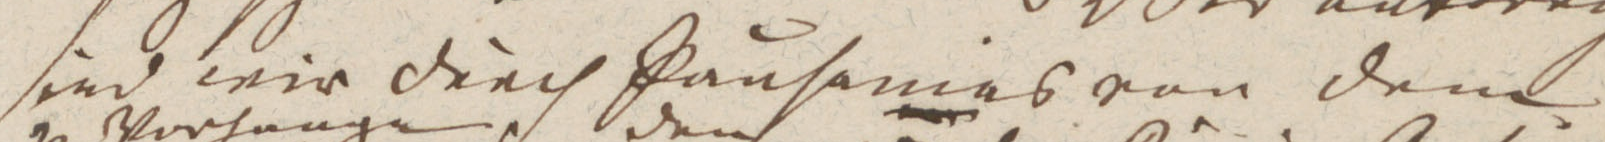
sind wir durch Pausanias von dem
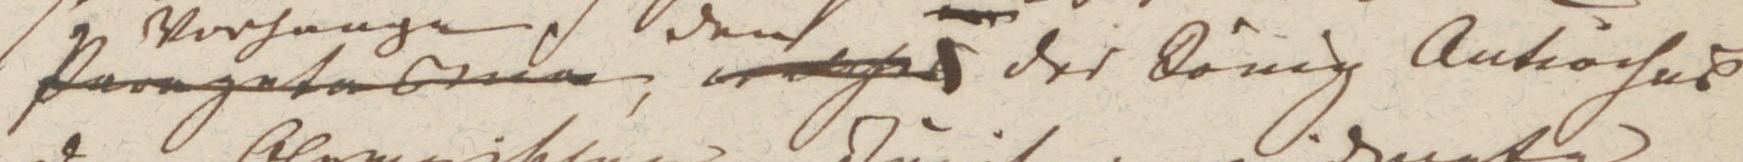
Parapetasma Vorhange, welches den der König Antiochus
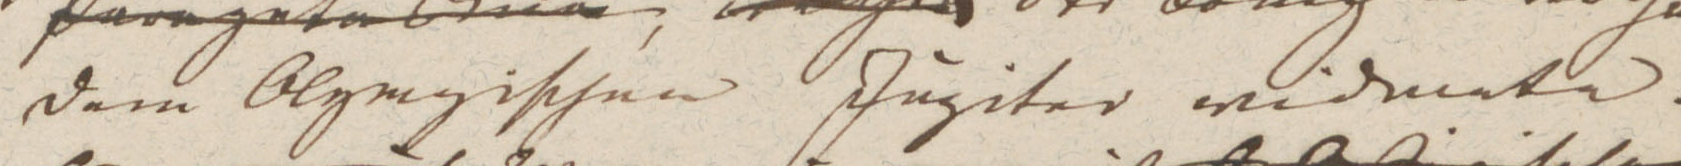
dem Olympischen Jupiter widmete.
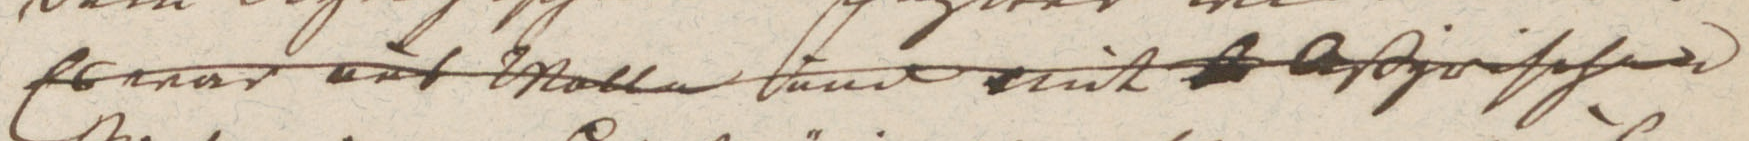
Es war aus Wolle und mit Assyrischen
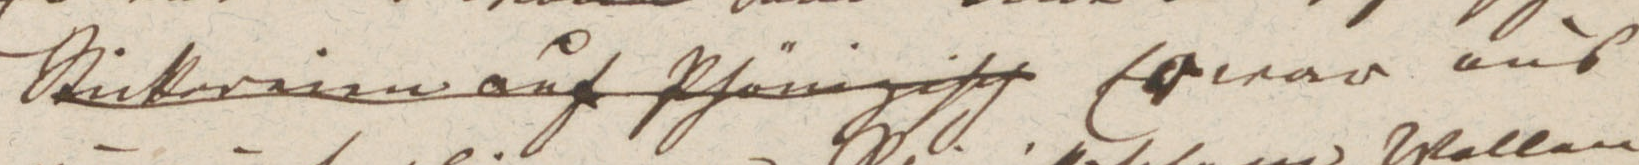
Stickereien auf Phönizisch Esr war aus
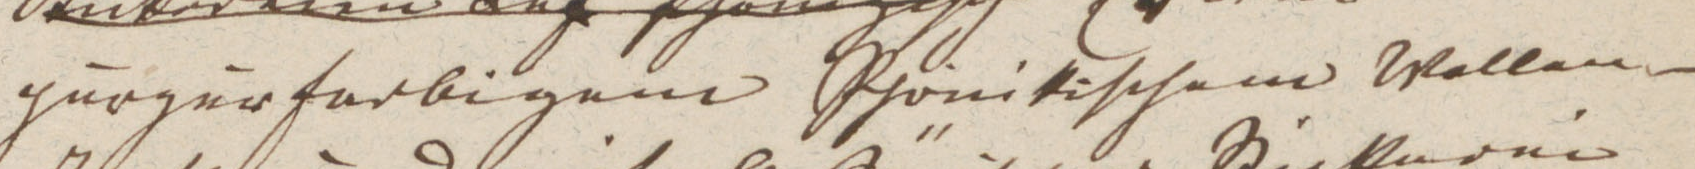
purpurfarbigem Phönikischem Wollen-
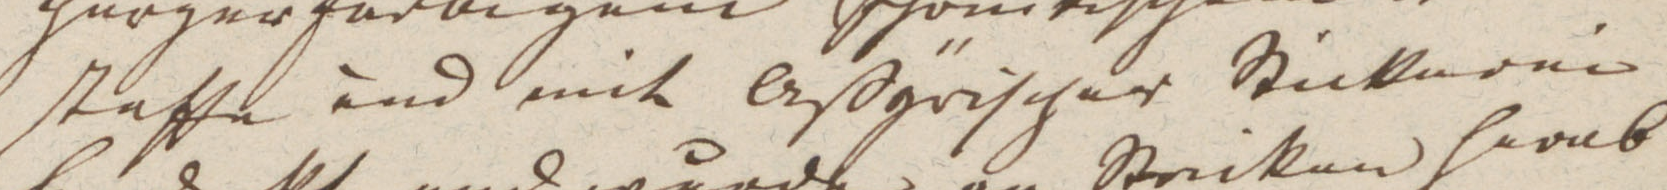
stoffe und mit Assyrischer Stickerei
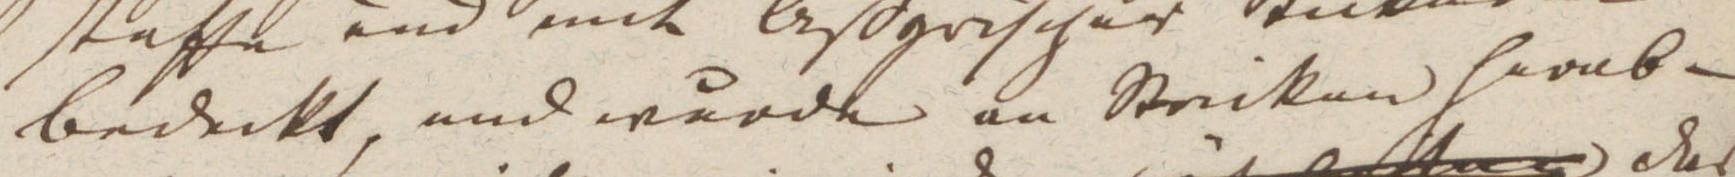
bedeckt, und wurde an Stricken herab-
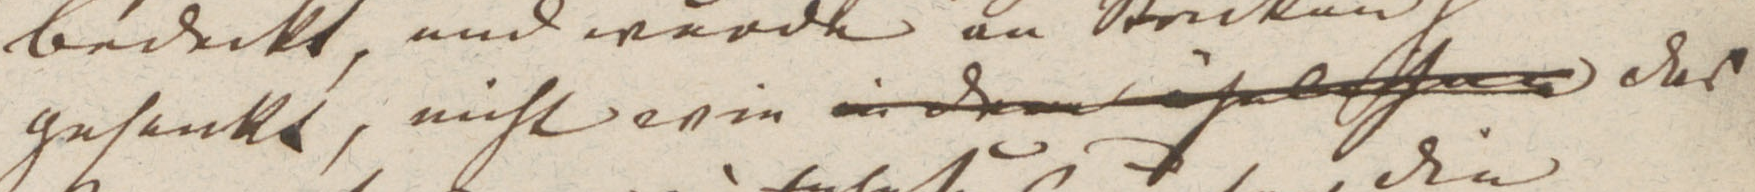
gesenkt, nicht wie in dem ähnlichen das
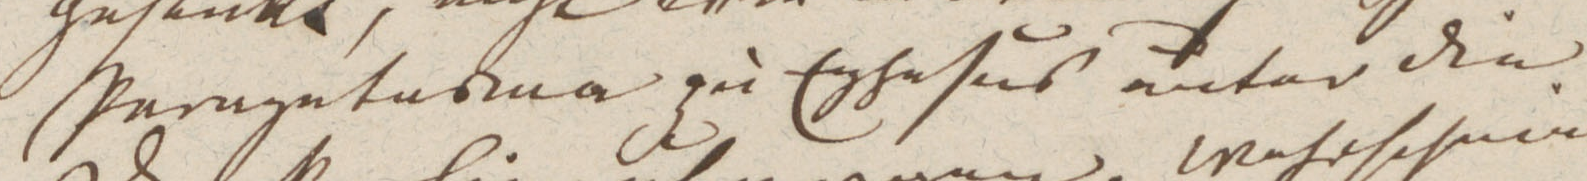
Parapetasma zu Ephesus unter die
